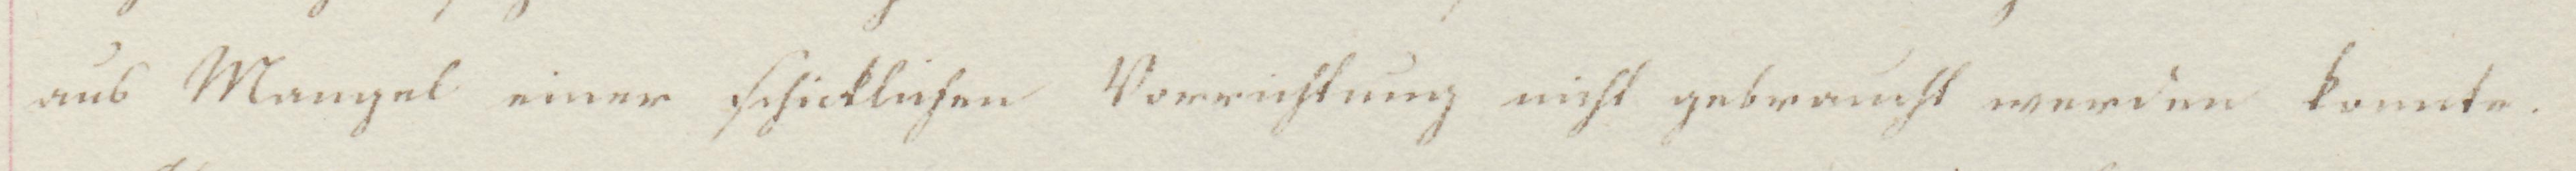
aus Mangel einer schicklichen Vorrichtung nicht gebraucht werden konnte.
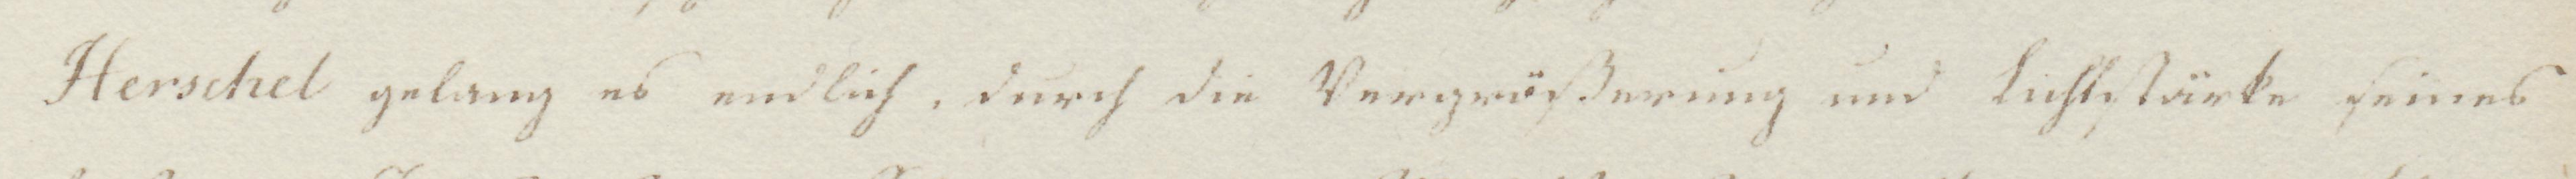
Herschel gelang es endlich, durch die Vergrößerung und Lichtstärke seines
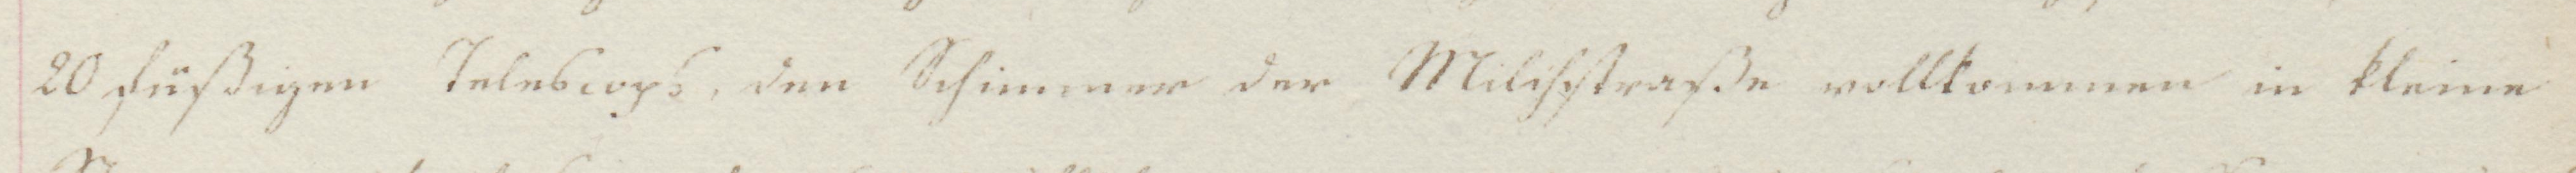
20 füßigen Telescops, den Schimmer der Milchstraße vollkommen in kleine
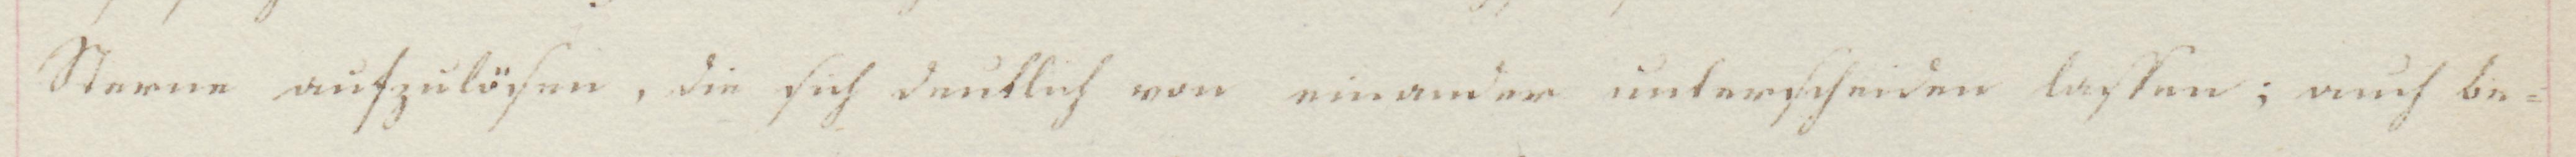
Sterne aufzulösen, die sich deutlich von einander unterscheiden lassen; auch be-
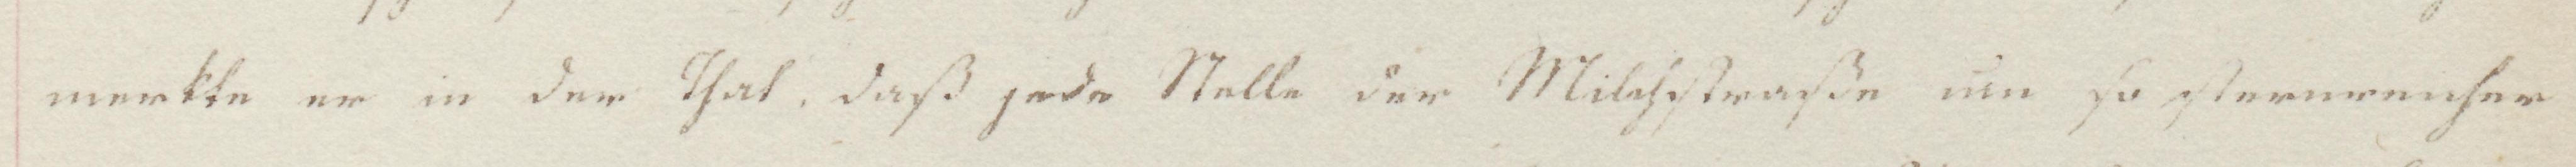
merkte er in der That, daß jede Stelle der Milchstraße um so sternreicher
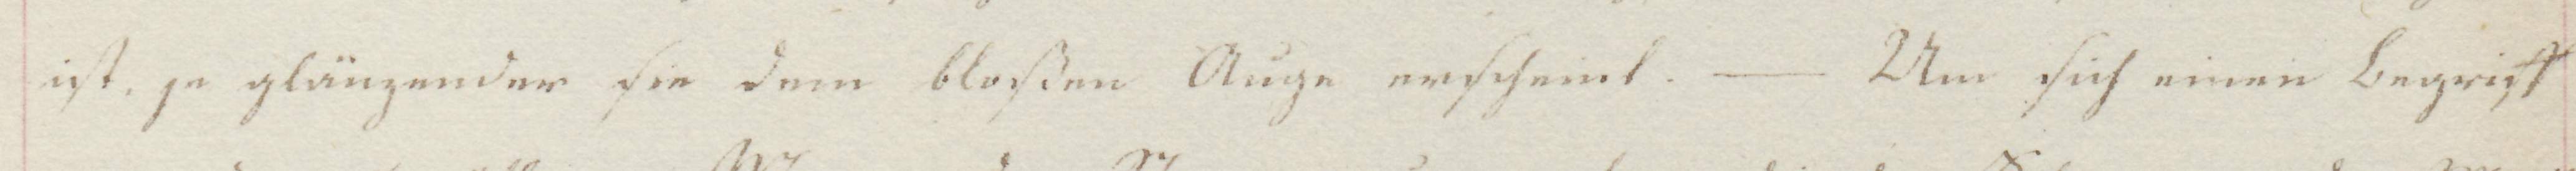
ist, je glänzender sie dem bloßen Auge erscheint. – Um sich einen Begriff
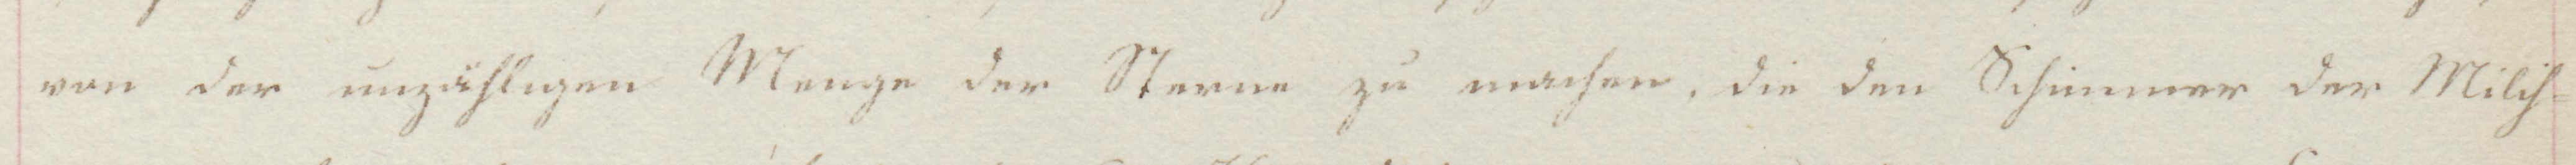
von der unzähligen Menge der Sterne zu machen, die den Schimmer der Milch-
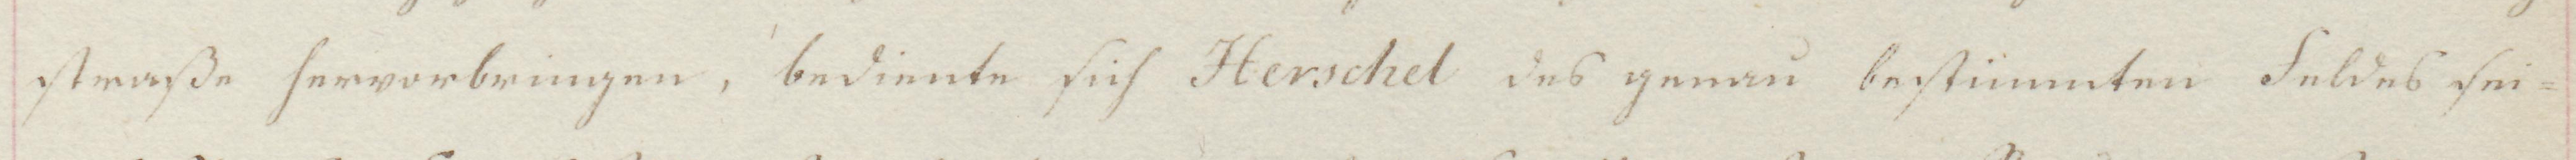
straße hervorbringen, bediente sich Herschel des genau bestimmten Feldes sei-
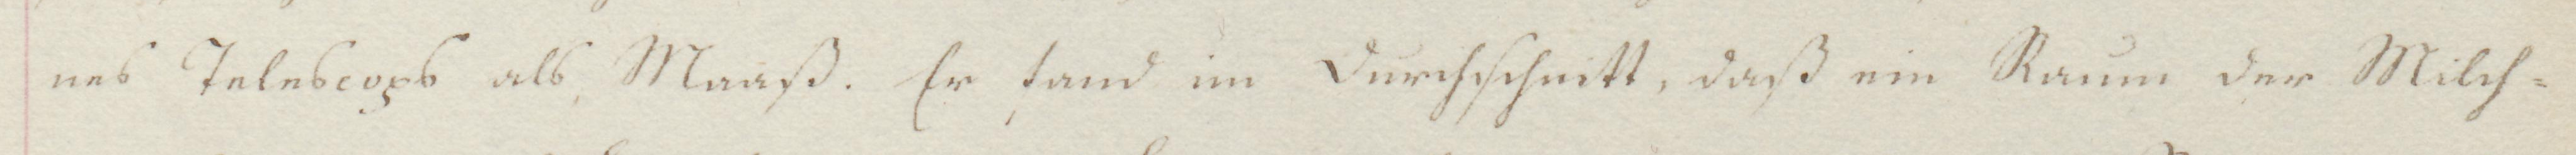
nes Telescops als Maaß. Er fand im Durchschnitt, daß ein Raum der Milch-
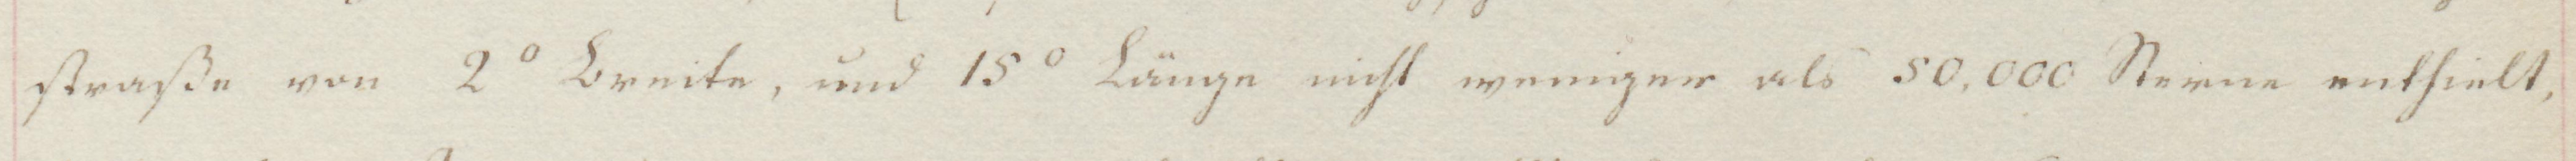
straße von 2° Breite, und 15° Länge nicht weniger als 50,000 Sterne enthielt,
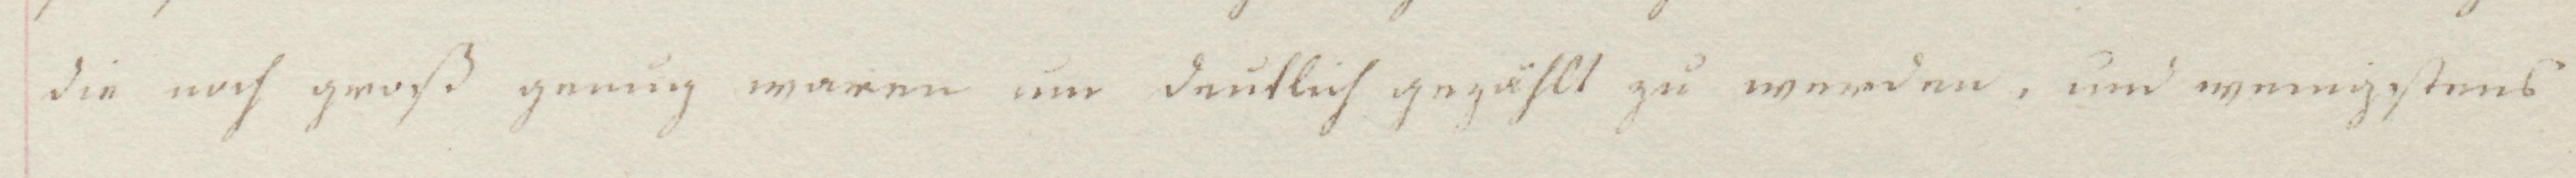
die noch groß genug waren um deutlich gezählt zu werden, und wenigstens
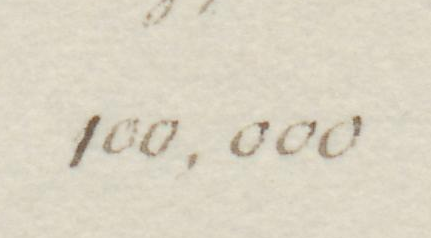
100,000
